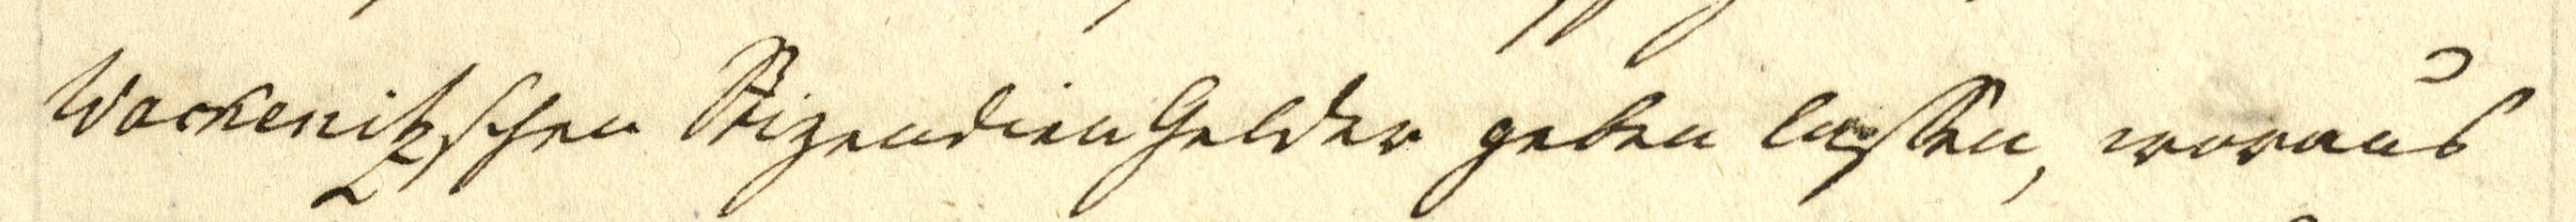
Wackenitzschen Stipendien Gelder geben lassen, woraus
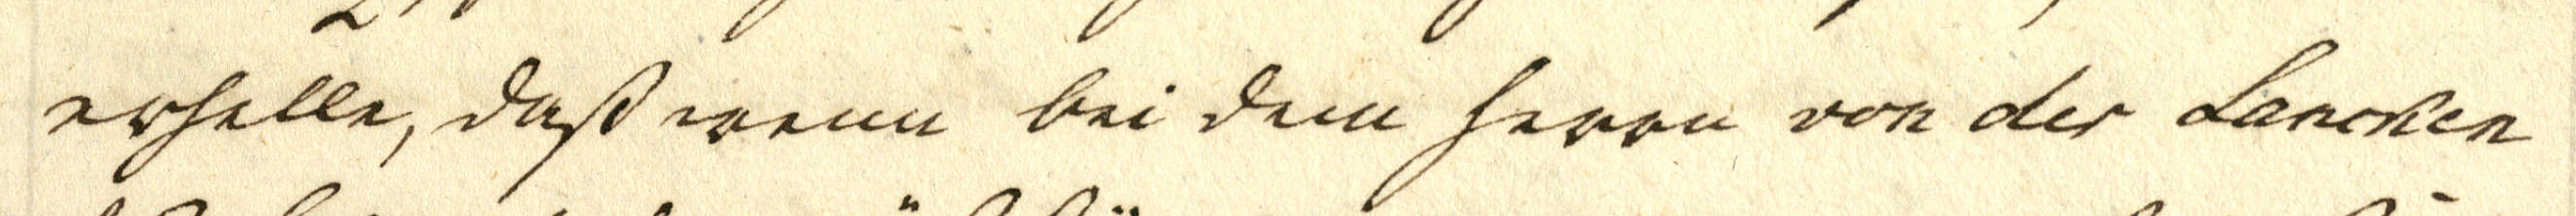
erhelle, daß wenn bei dem herrn von der Lancken
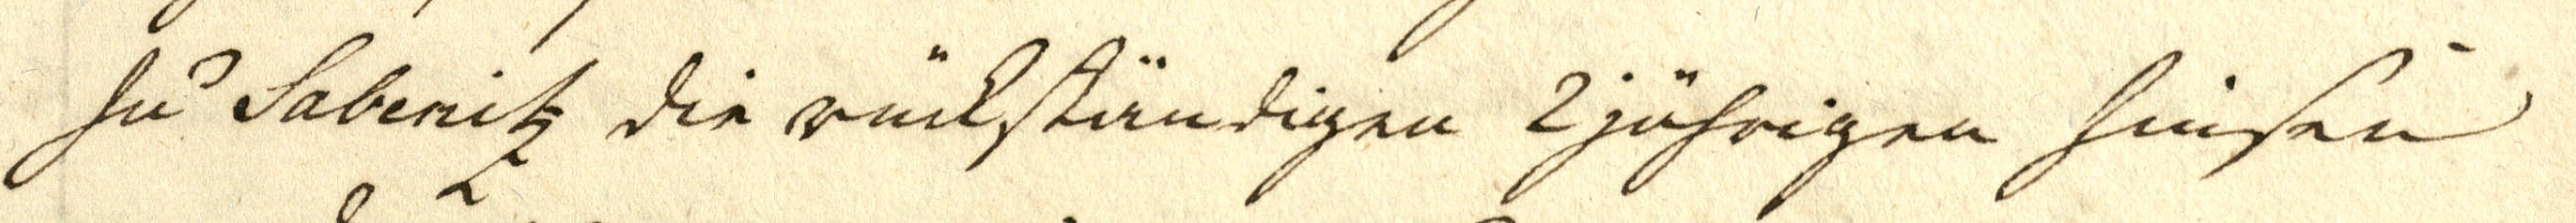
zu Sabenitz die rückständigen 2 jährigen Zinsen
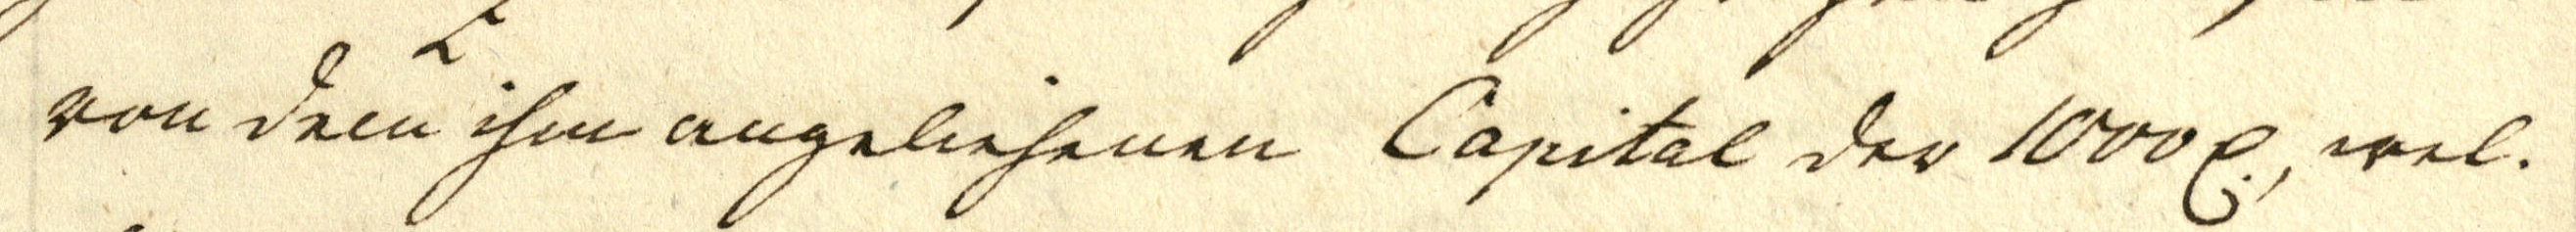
von dem ihm angeliehenen Capital der 1000 l., wel¬
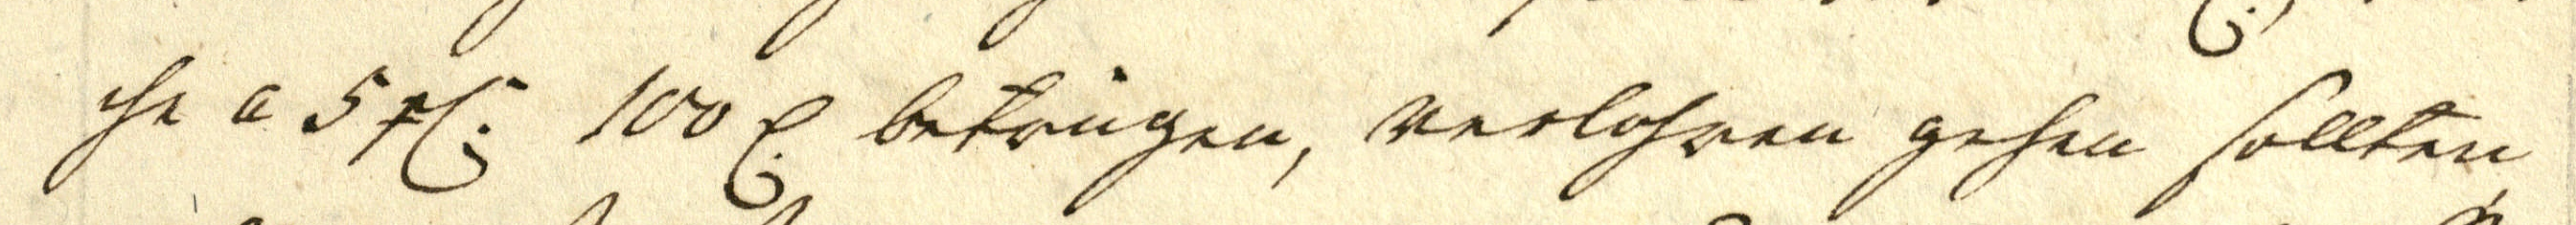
che a 5 pl. 100 l. betrügen, verlohren gehen sollten,
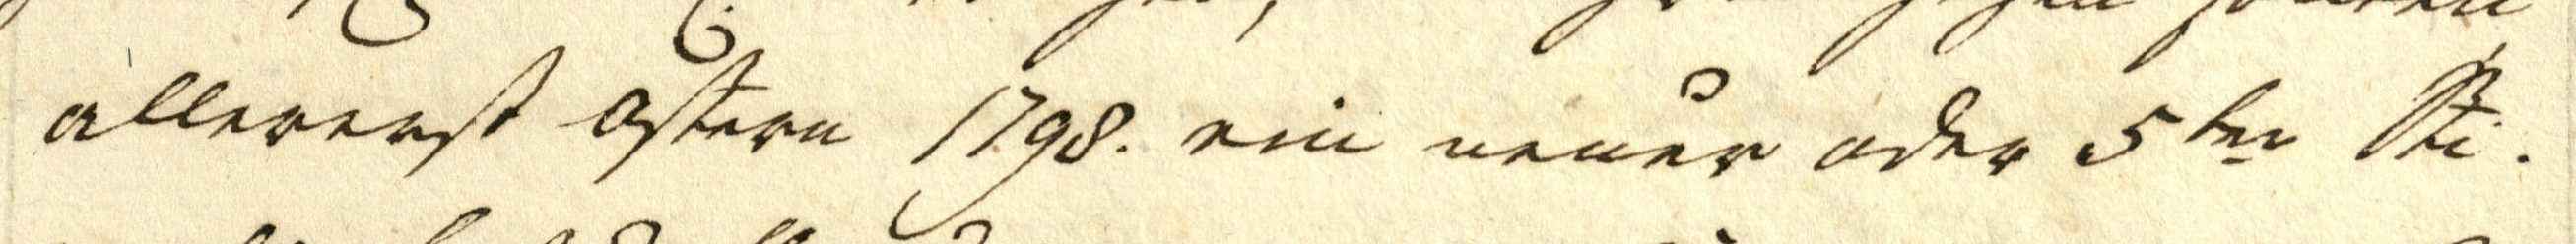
allererst ostern 1798. ein neuer oder 5 ter Sti¬
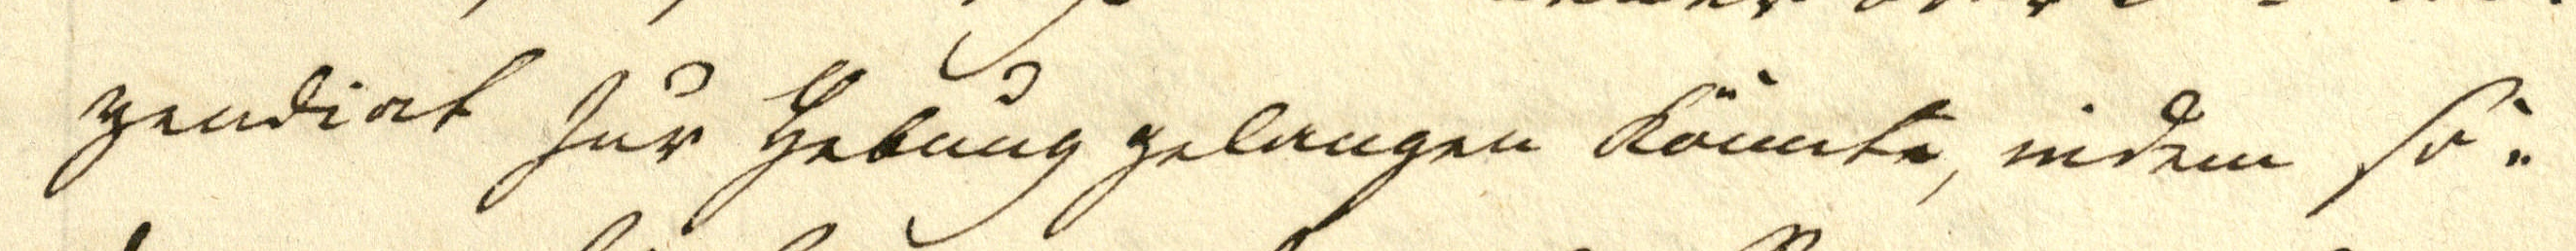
pendiat zur Hebung gelangen könnte, indem so¬
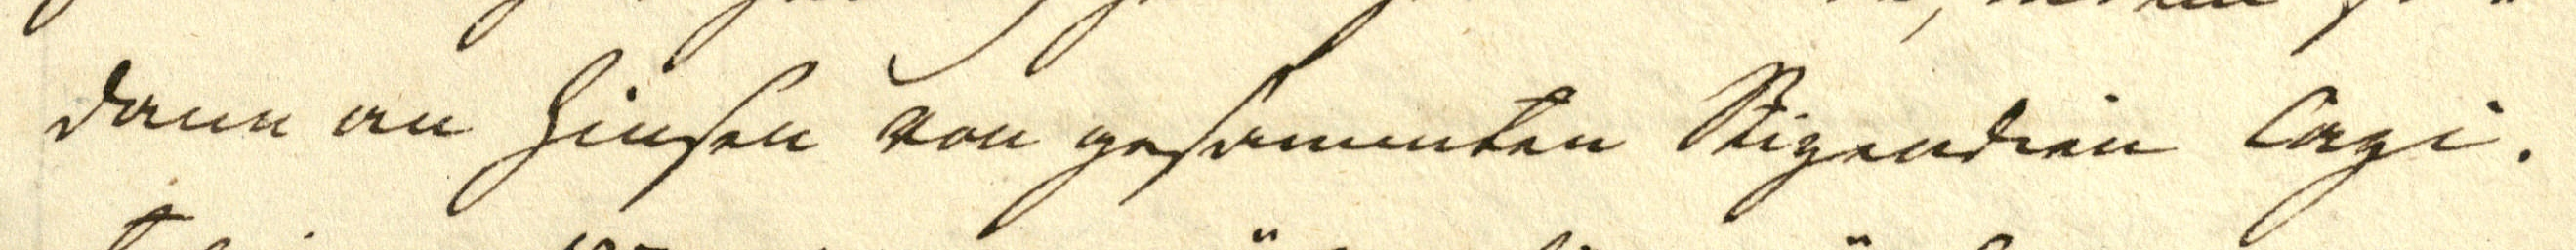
dann an Zinsen von gesammten Stipendien Capi¬
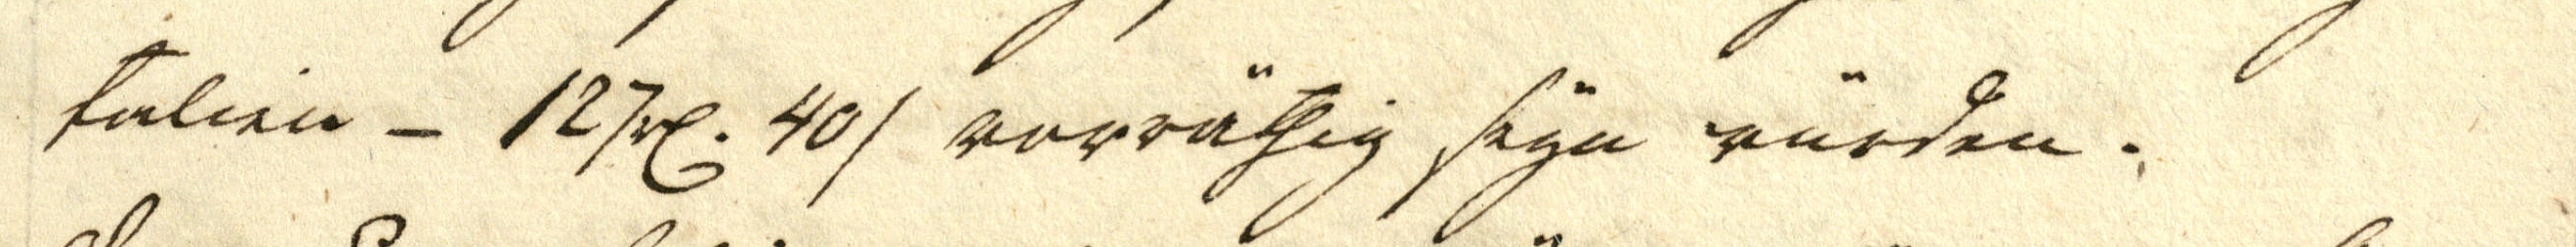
talien 127 r. 40s vorräthig seÿn würden.
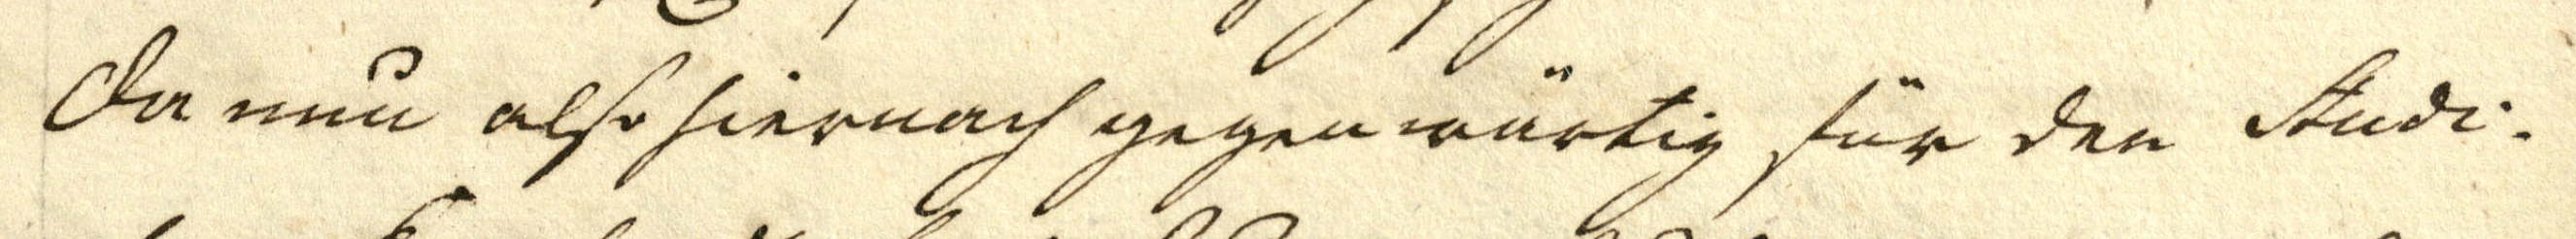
Da nun also hiernach gegenwärtig für den Studi
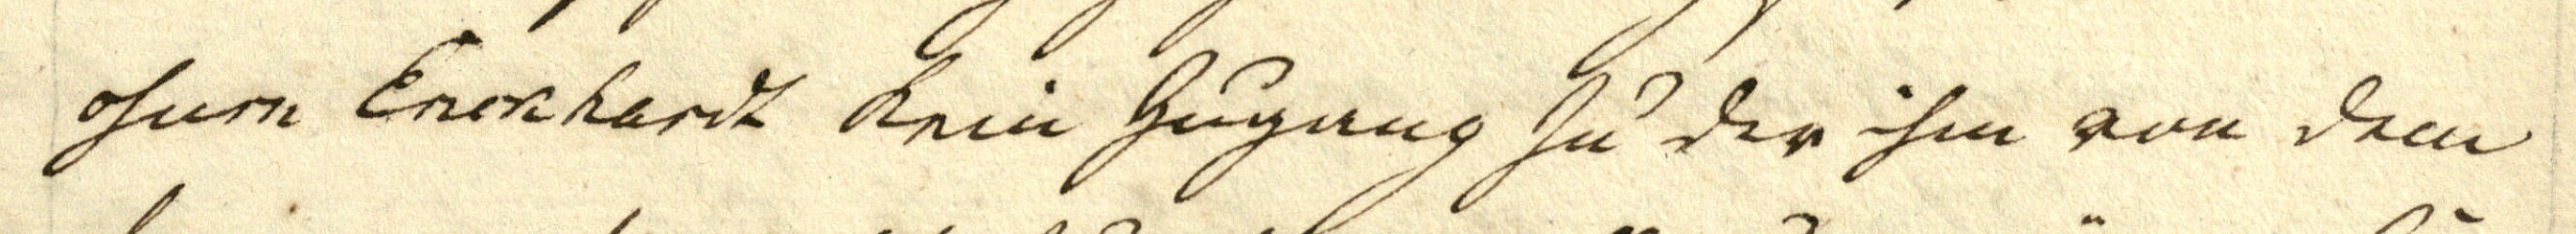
osum Enckhardt kein Zugang zu der ihm von dem
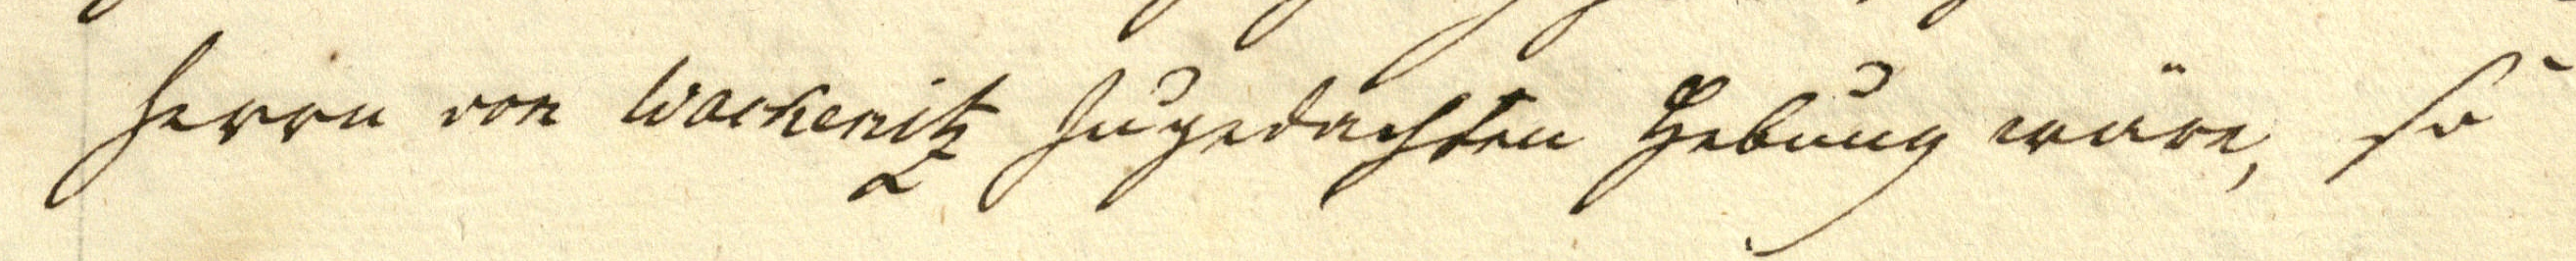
herrn von Wackenitz zugedachten Hebung wäre, so
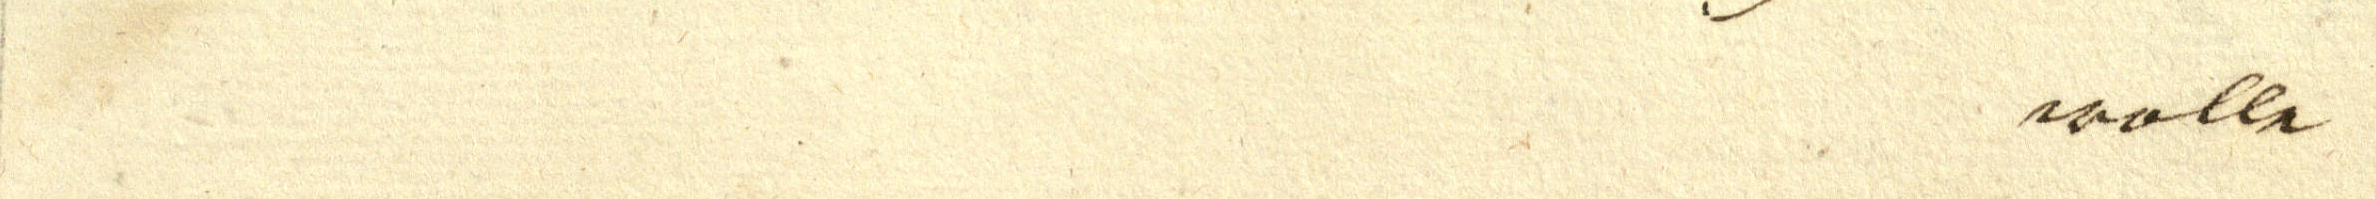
wolle
